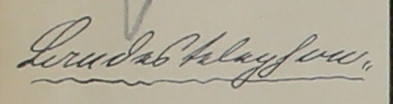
Landestelephon-
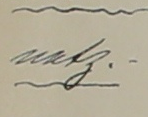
netz.
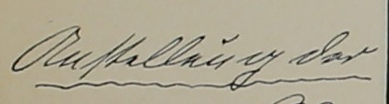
Anstellung der
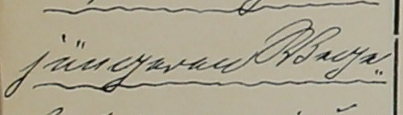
jüngeren Wege-
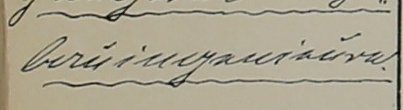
bauingenieure.
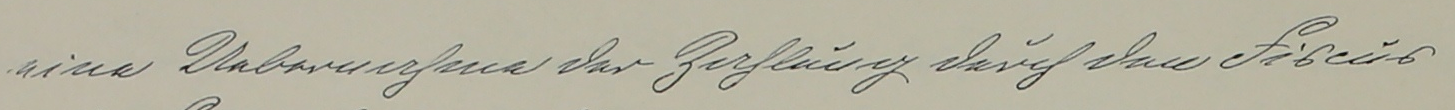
eine Uebernahme der Zahlung durch den Fiscus
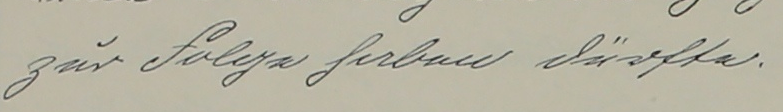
zur Folge haben dürfte.
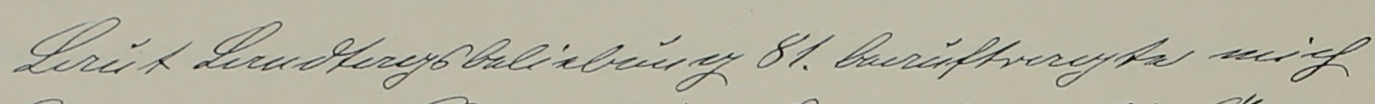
Laut Landtagsbeliebung 81. beauftragte mich
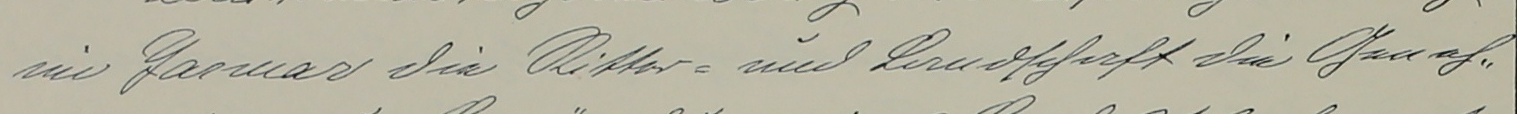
im Januar die Ritter- und Landschaft die Geneh-
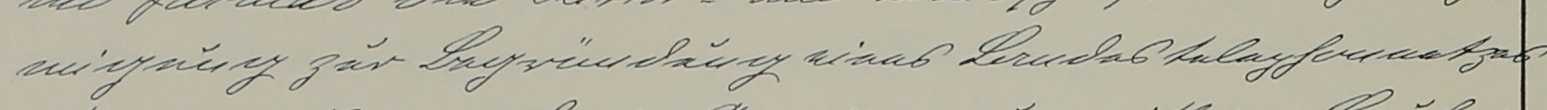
migung zur Begründung eines Landestelephonnetzes
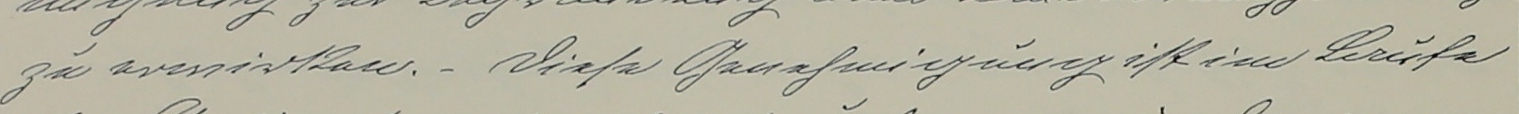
zu erwirken. - Diese Genehmigung ist im Laufe
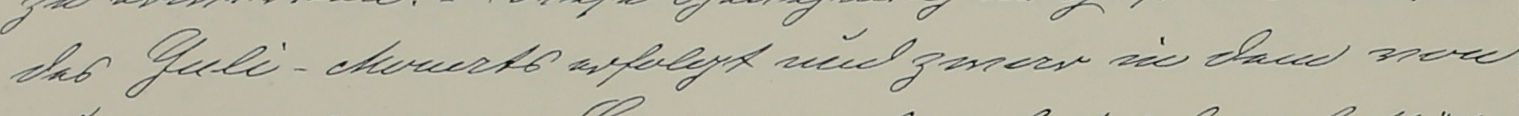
des Juli-Monats erfolgt und zwar in dem von
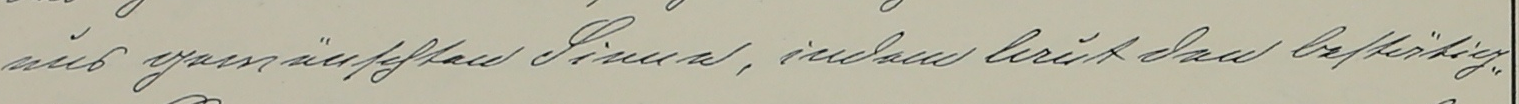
uns gewünschten Sinne, indem laut den bestätig-
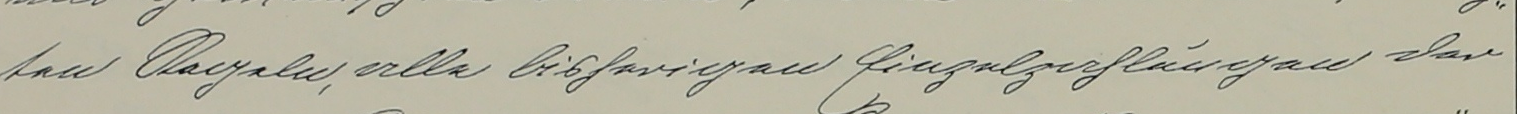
ten Regeln, alle bisherigen Einzelzahlungen der
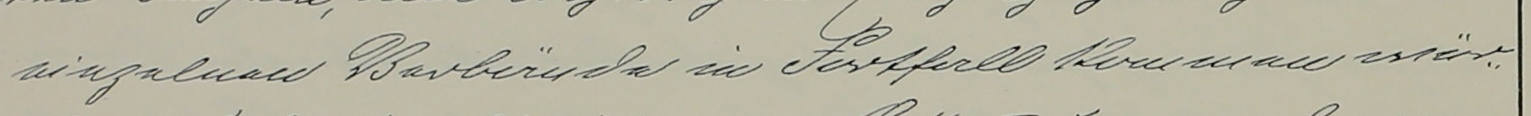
einzelnen Verbände in Fortfall kommen wür-
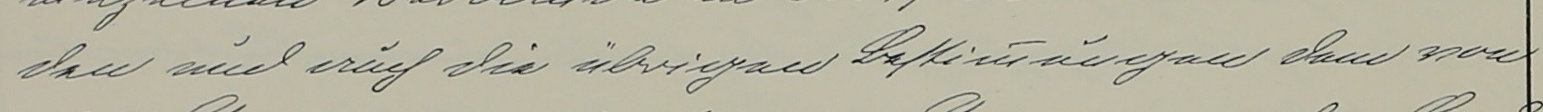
den und auch die übrigen Bestimmungen dem von
